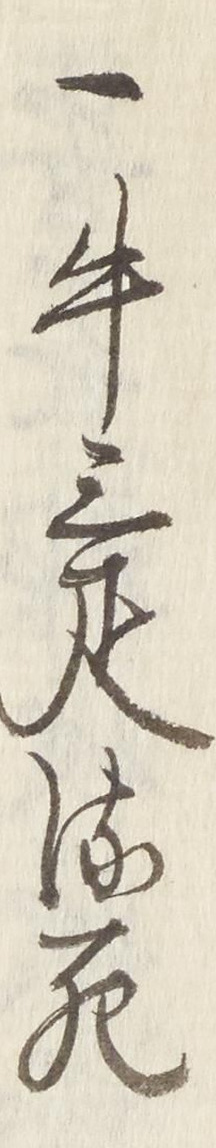一牛三疋流死
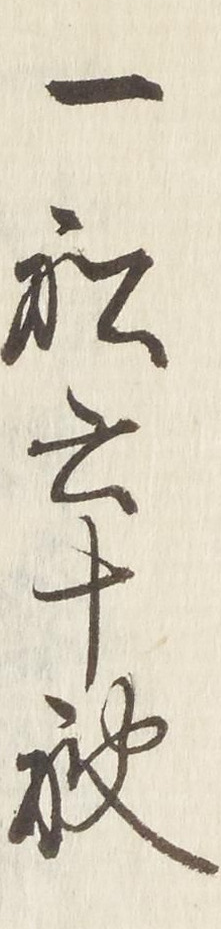一船六十艘
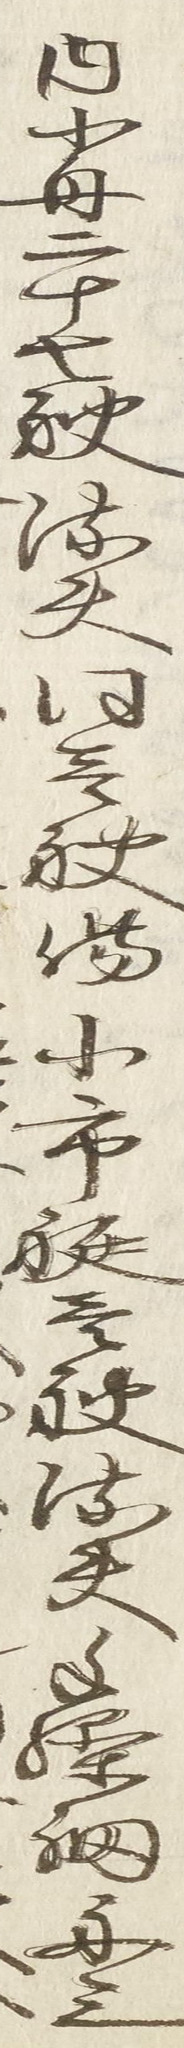内小舟二十七艘流失同壱艘傷小市艇壱艘流失手繰網舟三
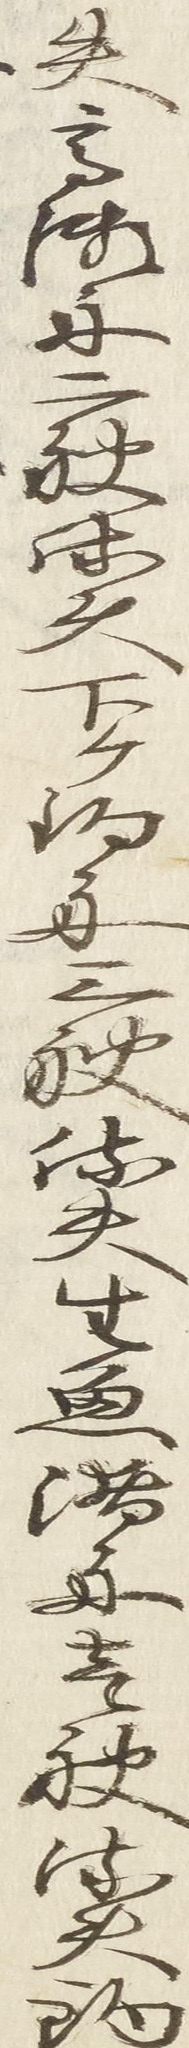失高瀬舟二艘流失下げ釣舟三艘流失生魚諸舟壱艘流失釣
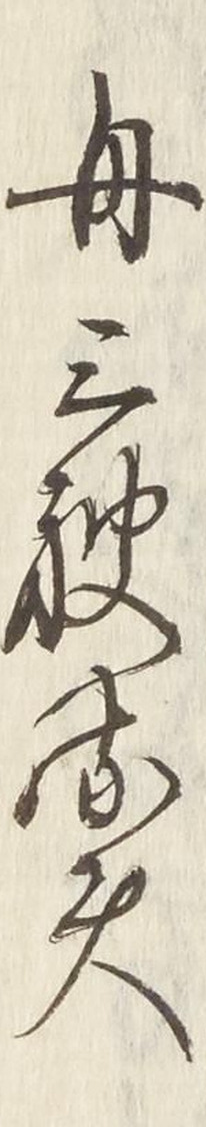舟三艘流失
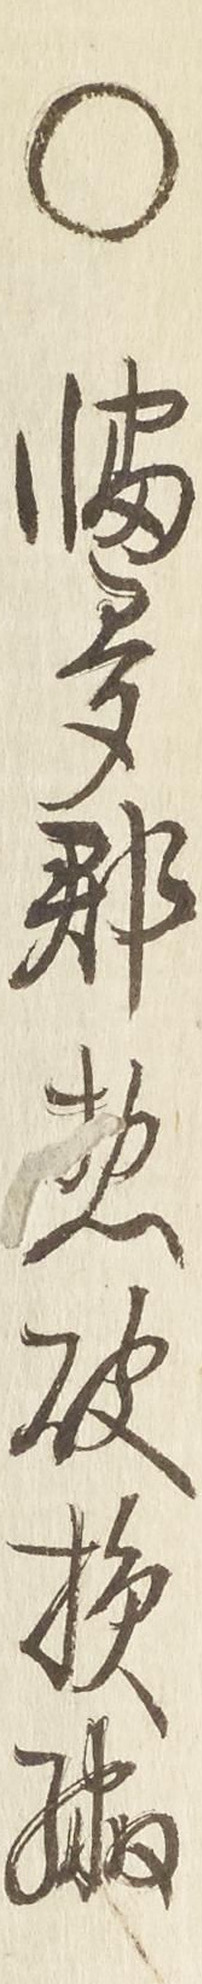◯幡多郡惣破損縮
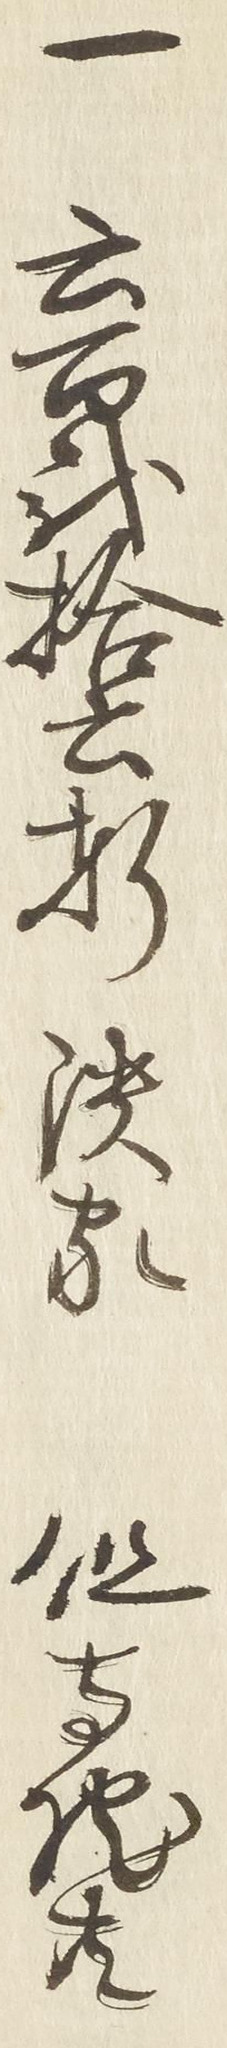一六百弐拾六軒流失但寺地共
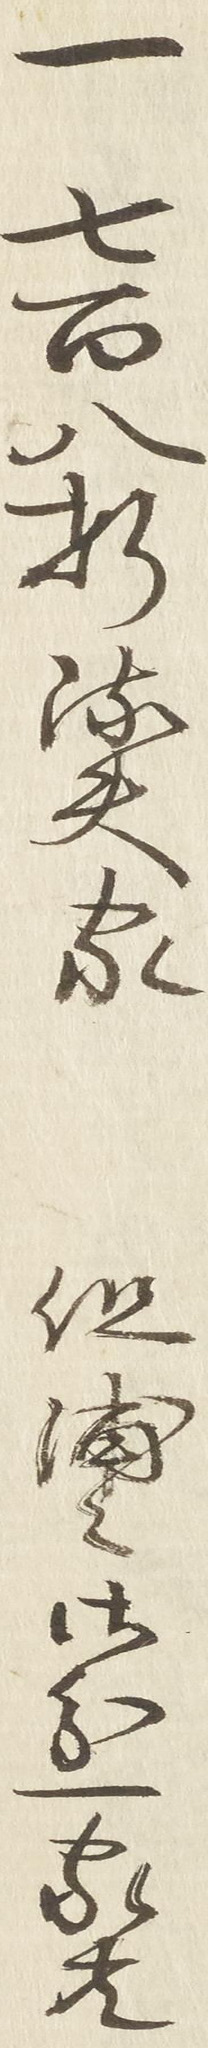一七百八軒流失家但浦々御分一家共
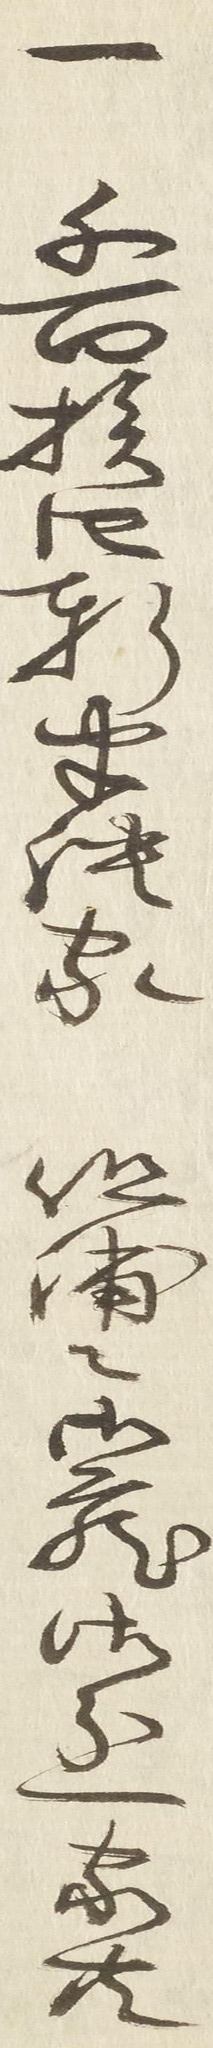一千百拾四軒半潰家但浦々御蔵御分一家共
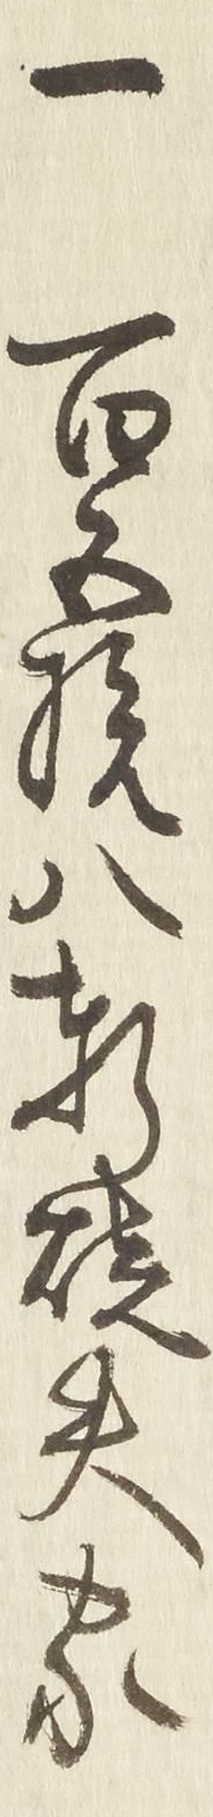一百五拾八軒焼失家
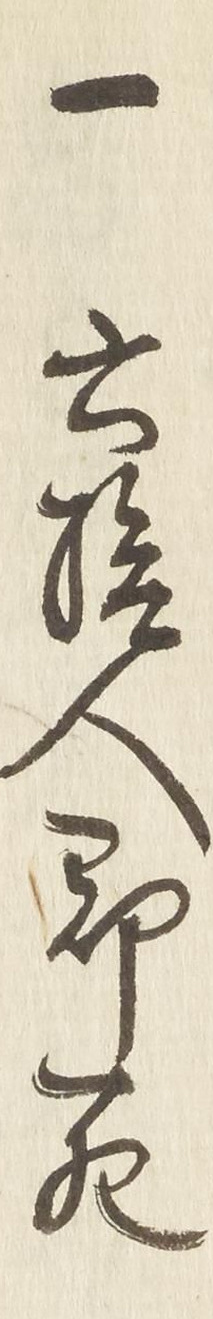一六拾人即死
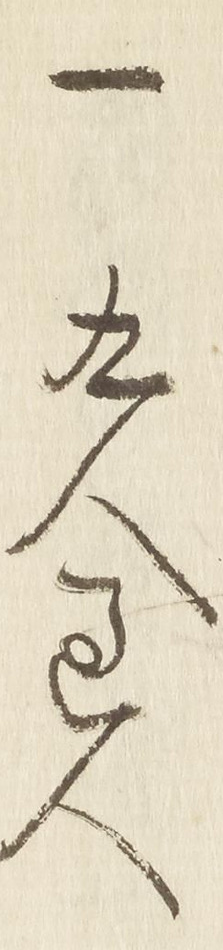一九人過人
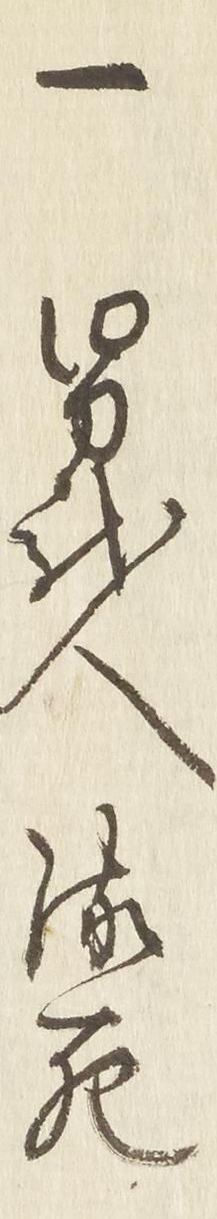一男弐人流死
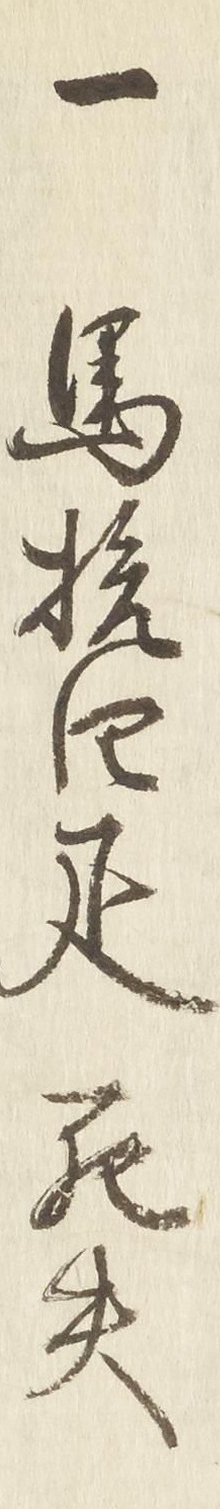一馬拾四疋死失
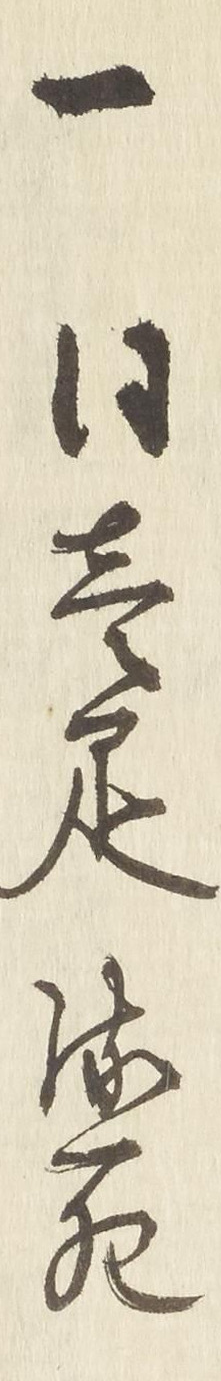一同壱疋流死

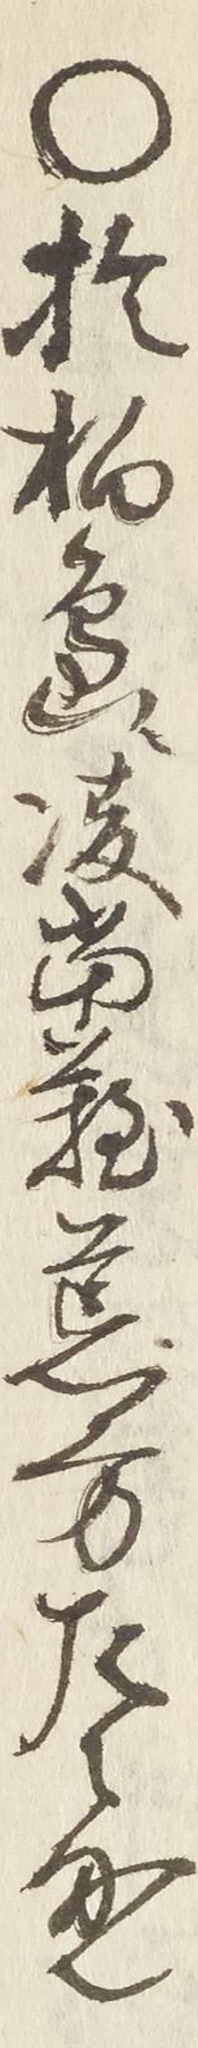◯於柏嶋二凌当難荒方左之通
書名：地震記　下
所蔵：東京大学地震研究所図書室 Earthquake Research Institute Library, The University of Tokyo, JAPAN
